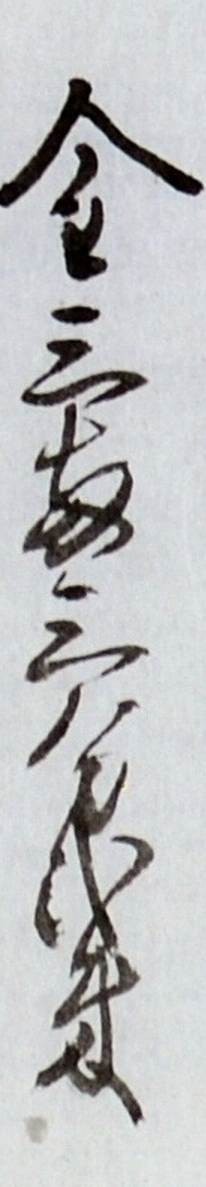金三両三分弐朱
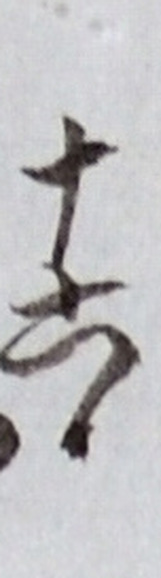十六日
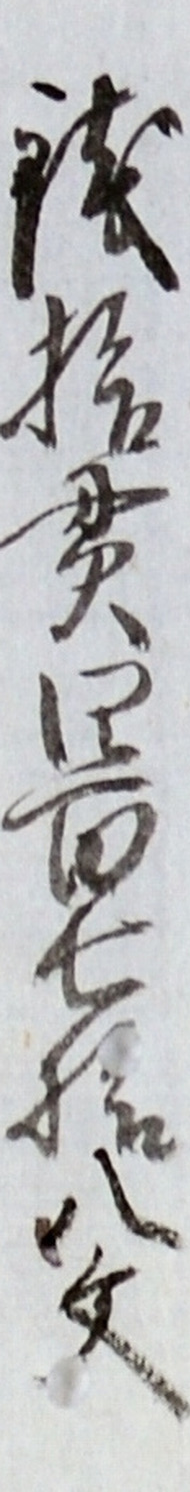銭拾貫四百七拾八文
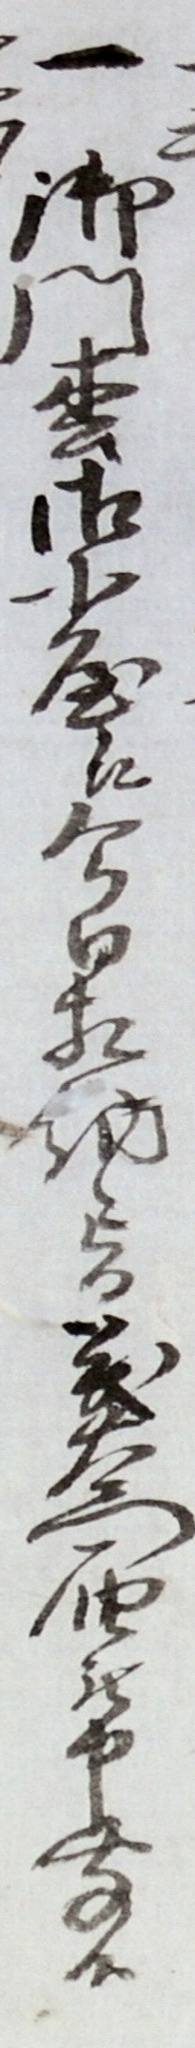一御門番御小屋江今日相納之旨義右衛門届被申聞候
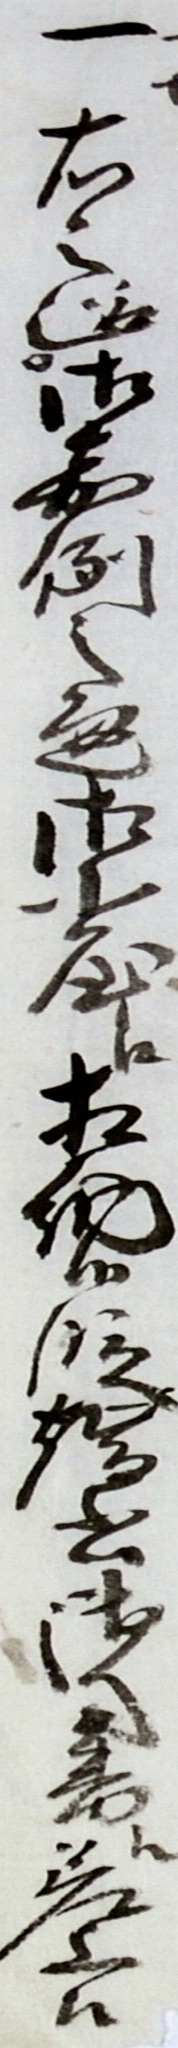一右之趣御番例之通御小屋江相納候段端書御用番江差上候

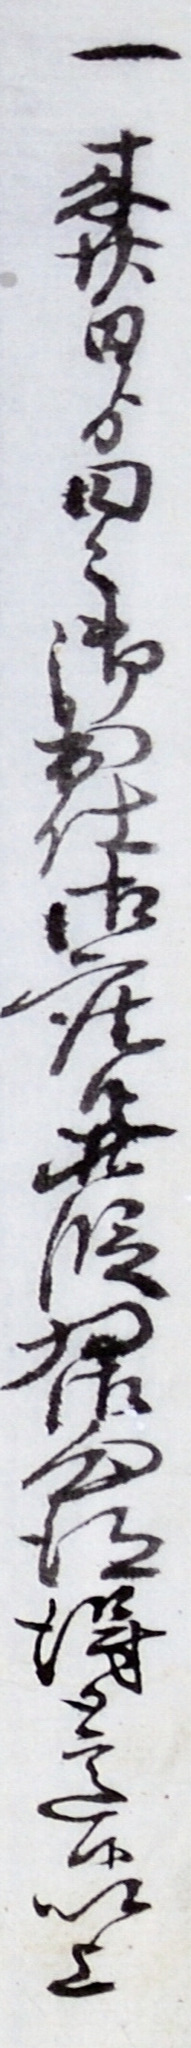一来廿日より日々御出仕御座候此段為御心得御意候以上
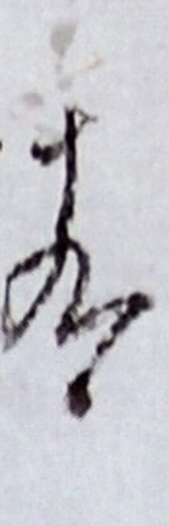十九日
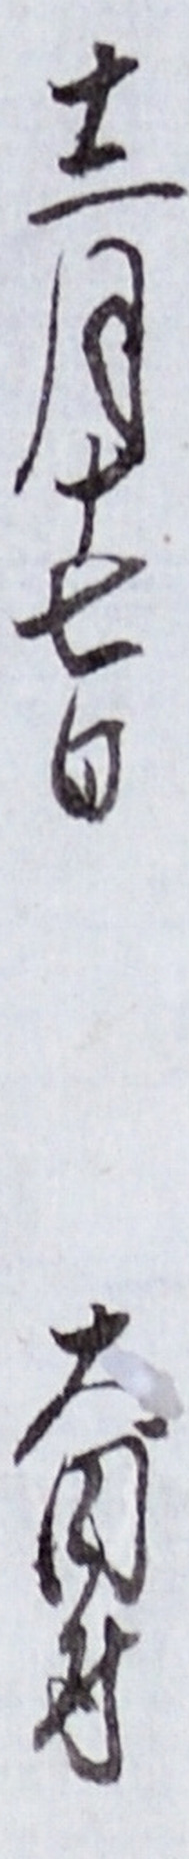十二月十七日大目付
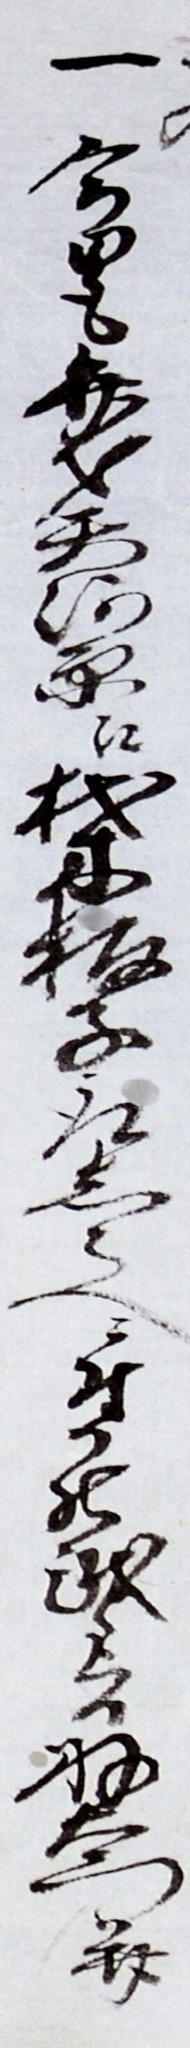一今日も弁才矢河原江材木板子取しらへニ付罷越候羽右衛門并
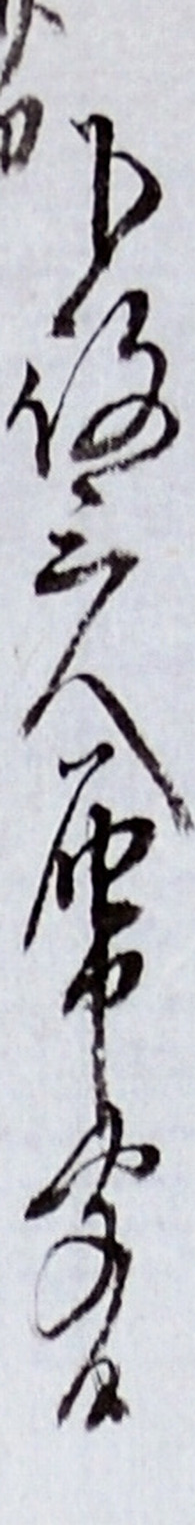下役三人届申聞候
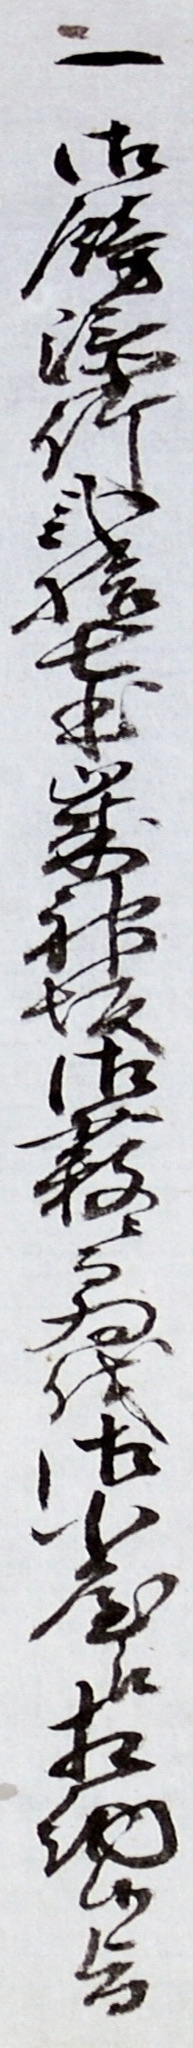一御餝添竹弐拾七本歳神坂御藪ニ而為伐御小屋江相納候旨
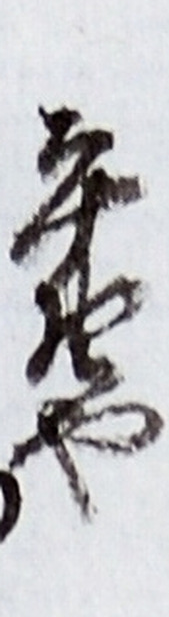平野や
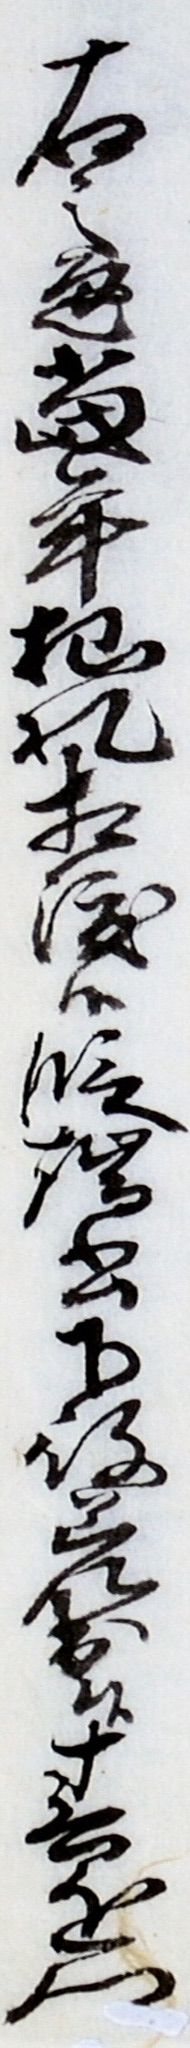右之通当年杣札相渡候段端書下役差出候春近郷
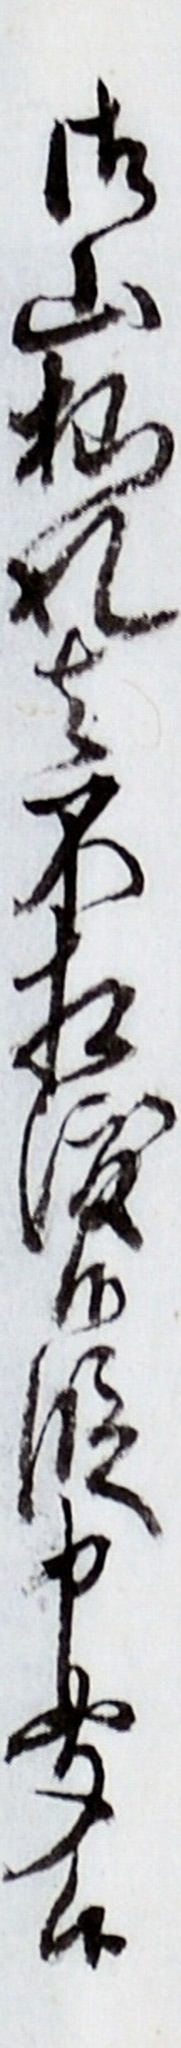御山杣札は不相渡候段申聞候
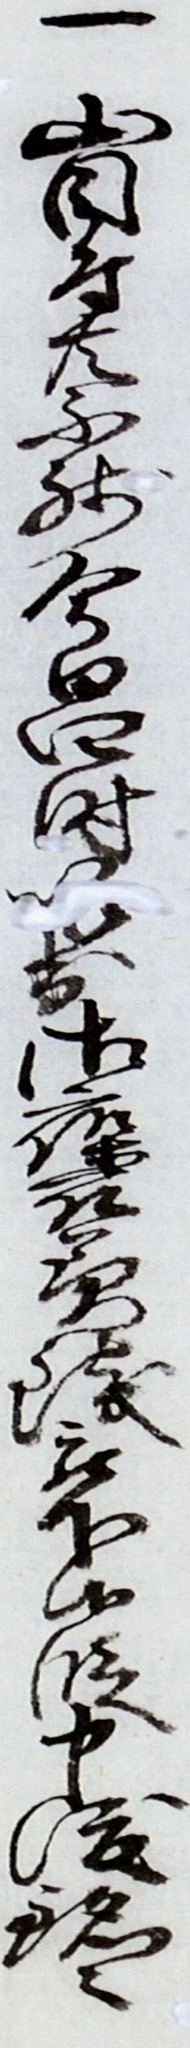一山目付共不残今日四時以前御褒美銀被下候段申渡銘々
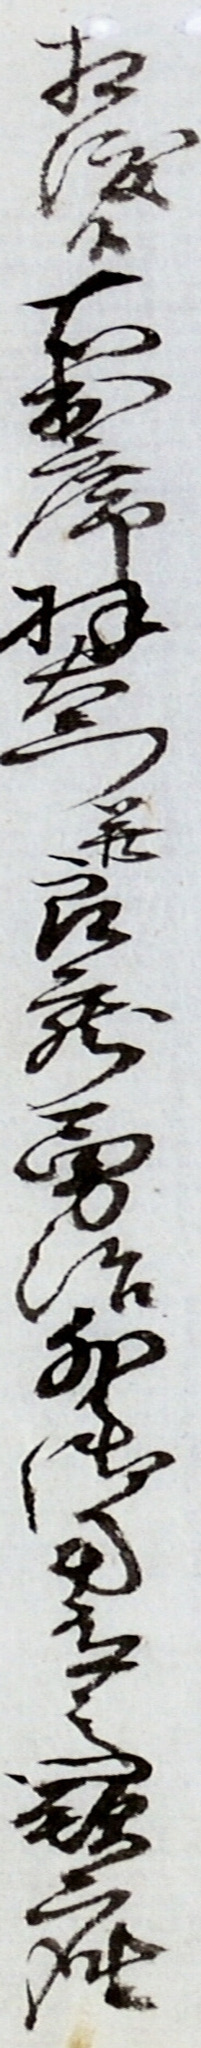相渡候右出席羽右衛門并良蔵勇治外御用有之窺御座
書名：御山奉行御用控
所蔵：伊那市立高遠町図書館・合同会社AMANE
